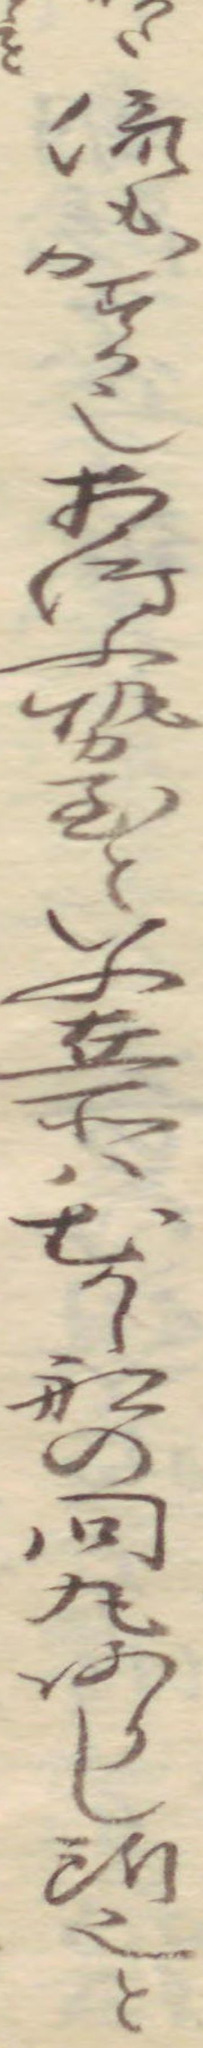流もかすか也相伝ふ勢至といふ在所はむかし船の問丸ありし所也と
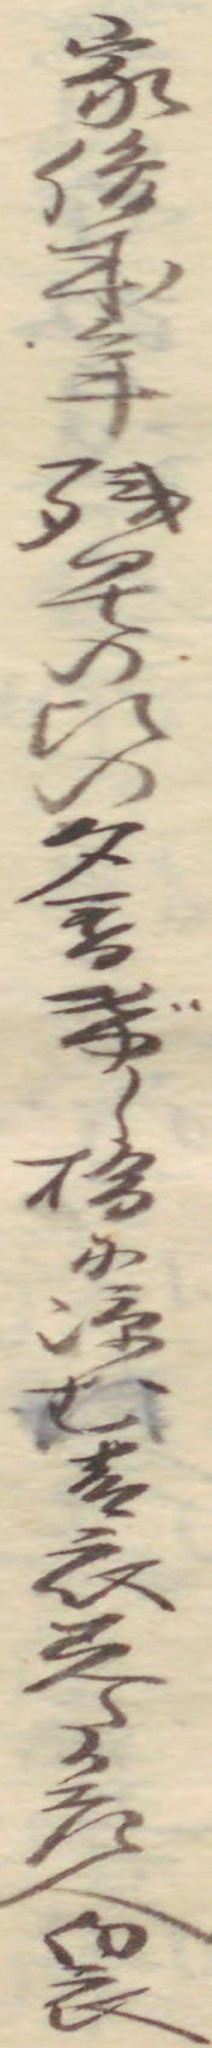家俊或歳残暑の比の夕暮れげし橋に涼む青衣着たる老人白衣
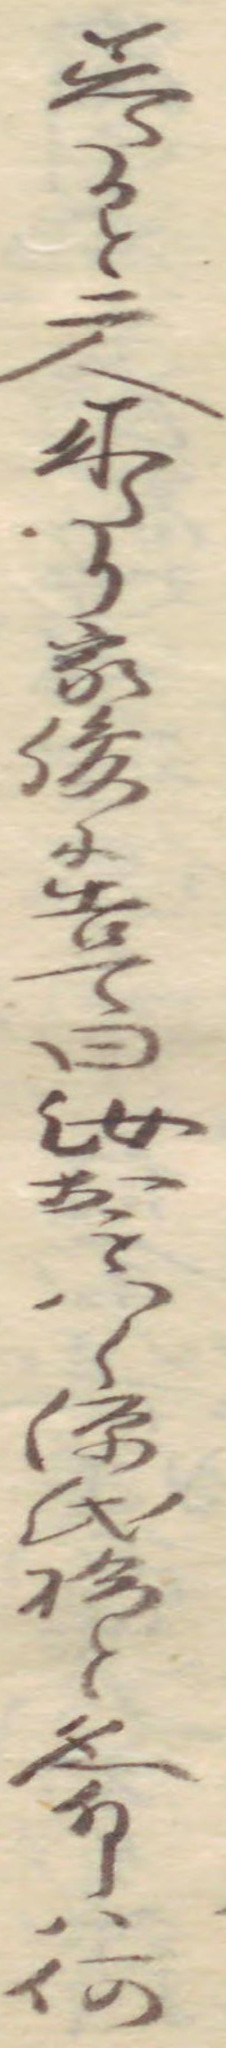着たると二人来たり家俊に告て曰汝おもはく源氏橋と名付しは何
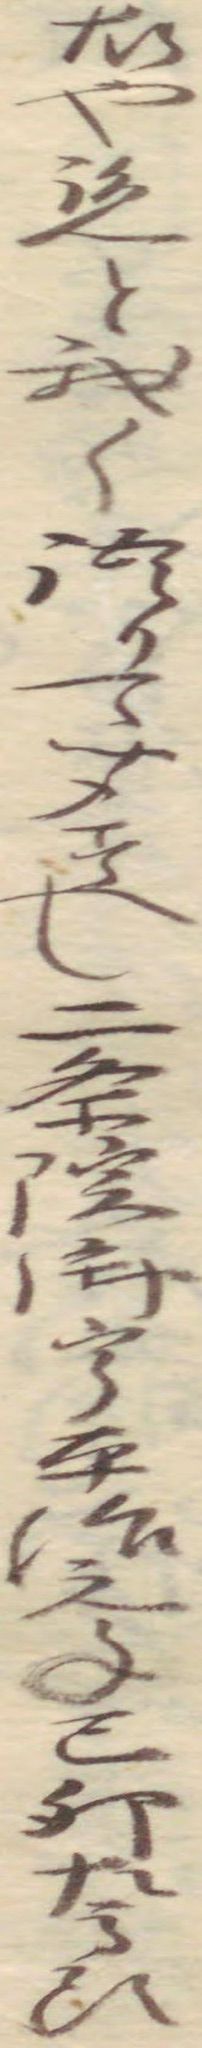故や覧と我〳〵語りて聞すへし二条院御宇平治元年己卯左馬頭
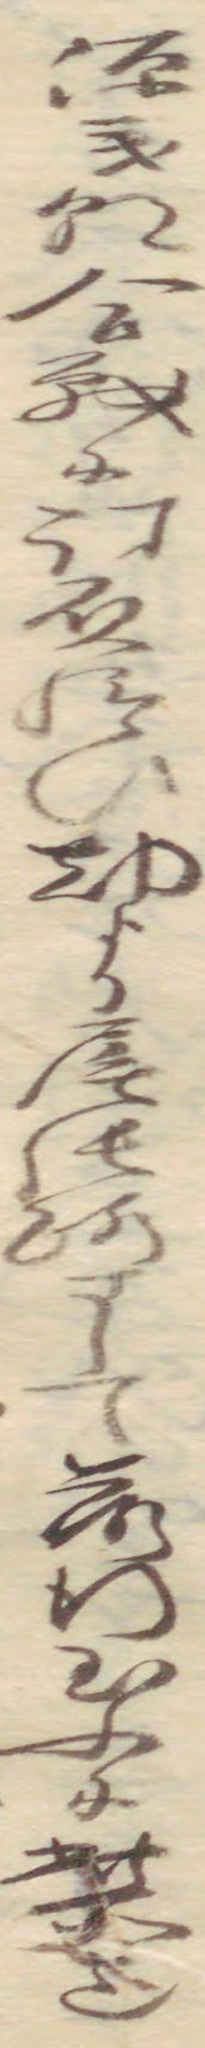源義朝合戦に打負給ひ都より尾張路さして落行玉ふに此所迄
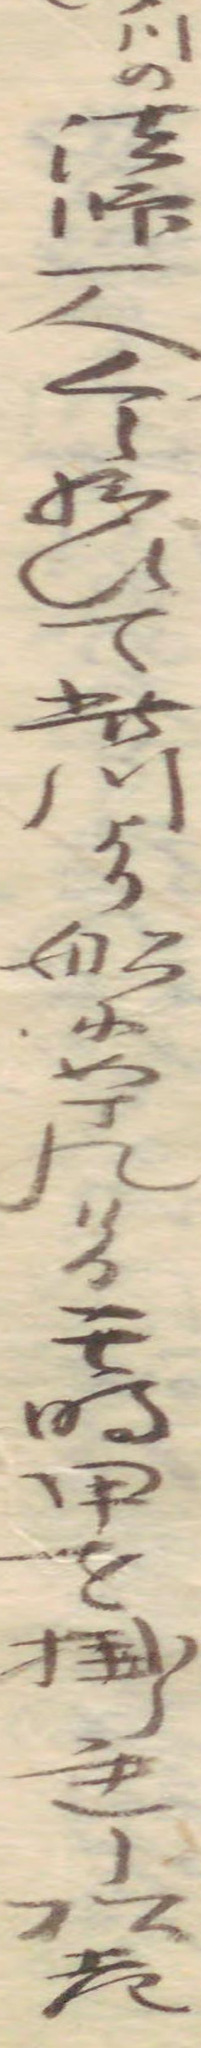法師一人くし給ひて此川より船にめされける其時甲を掛し松老
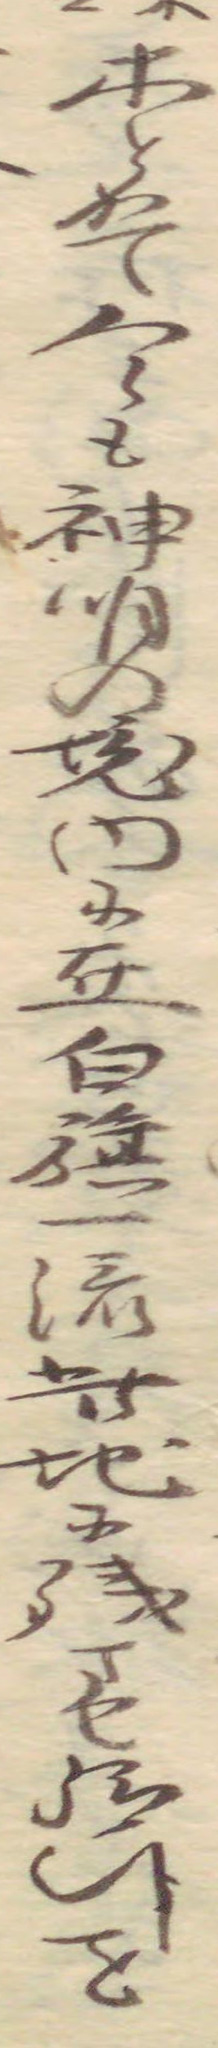木と成て今も神明の境内に在白旗一流此地に残させ給ひしを

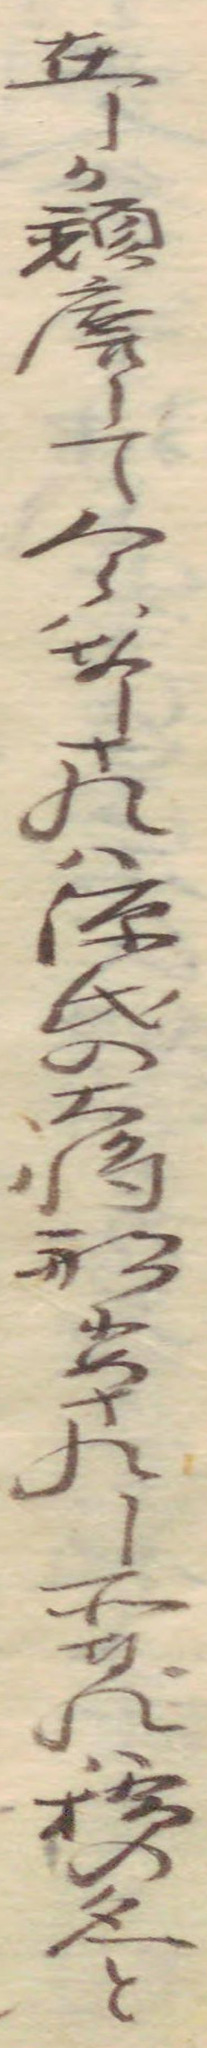在しか頽廃して今はなしされは源氏の大将船にめされし所なれは橋の名と
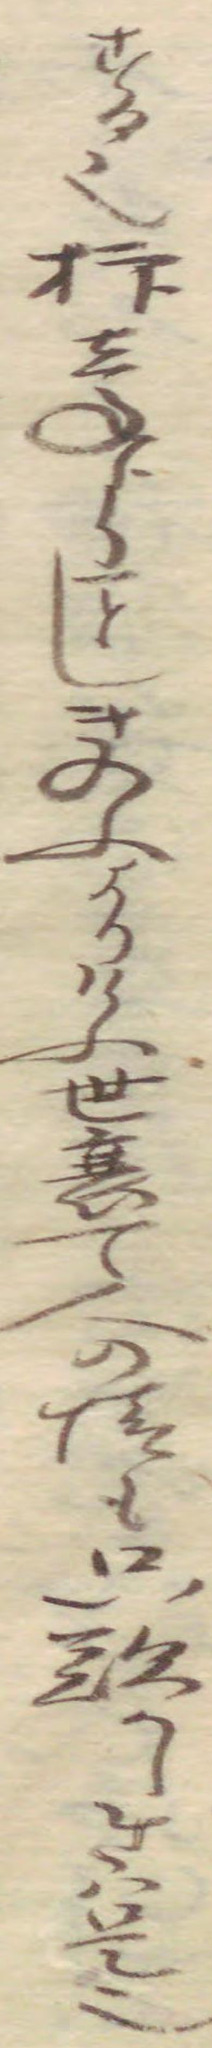する也抑去年よりことしきのふよりけふ世衰て人の情も只歎かしきは是也
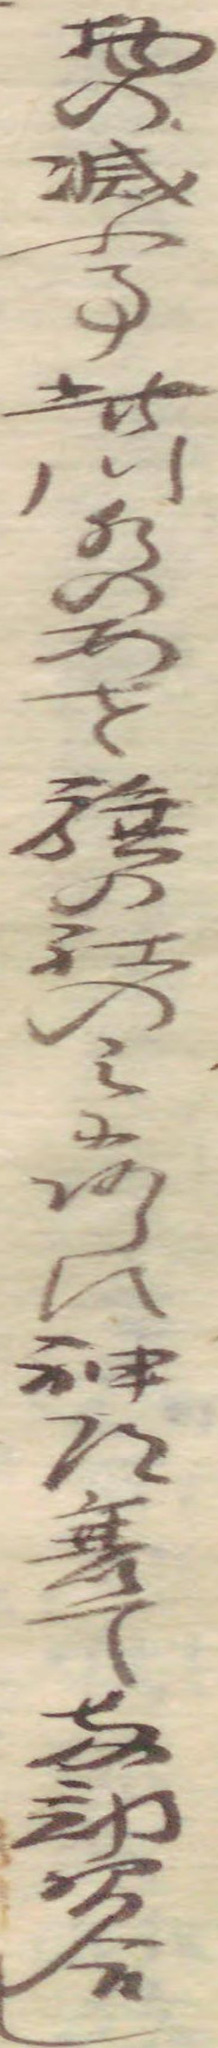物の滅ふ事此川水のあせ旗の社のみにあらす神道衰て両部習合し
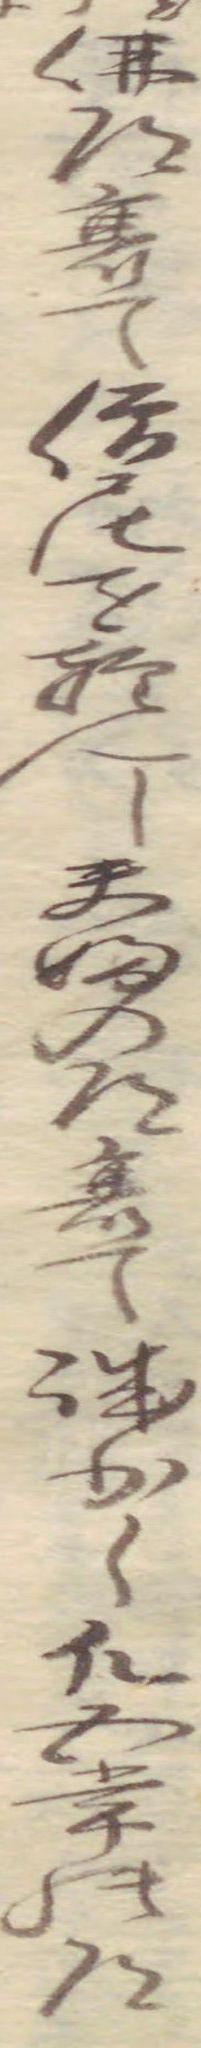仏道衰て僧尼を軽んし夫婦の道衰て誠少く凡五常の道
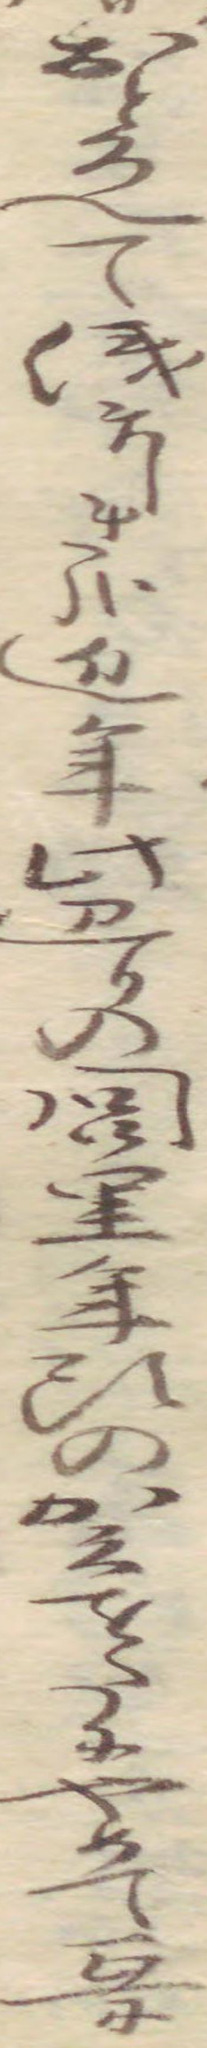おとろえて浅ましき哉近年此辺りの閭里年頭の賀をたにやめて互に
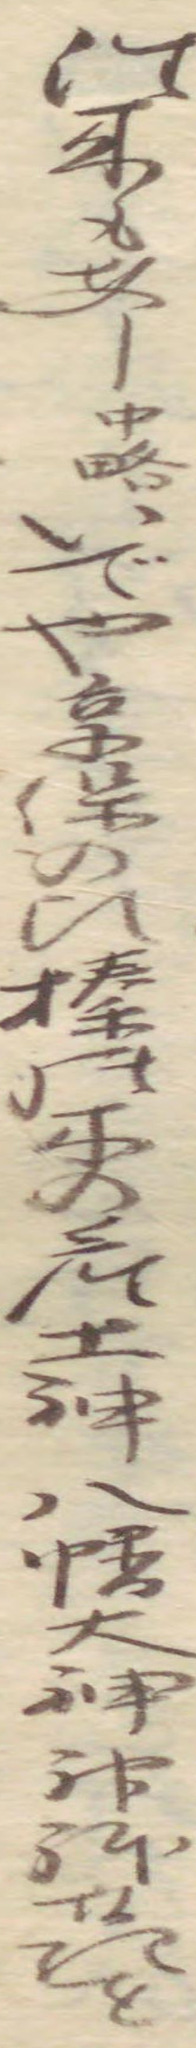往来もなし中略いでや享保の比榛の木の産土神八幡大神神躰なきを
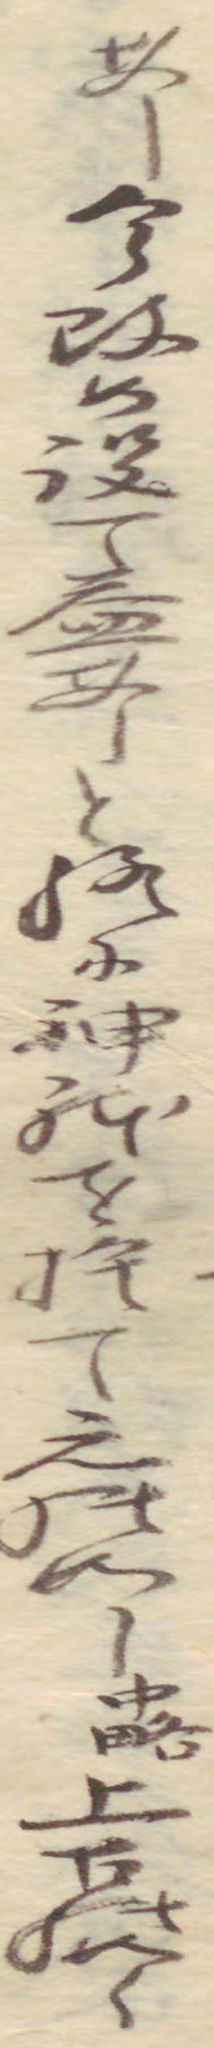なし今改め設て益なしと終に神躰を捨て元の如し中略上古の如く
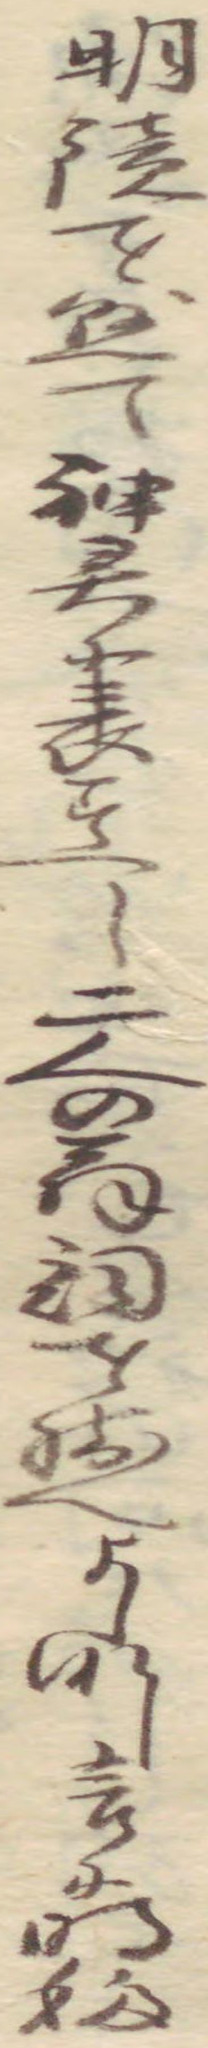明鏡を懸て神霊に表すへし二人の翁詞を揃へよしなし言に時移
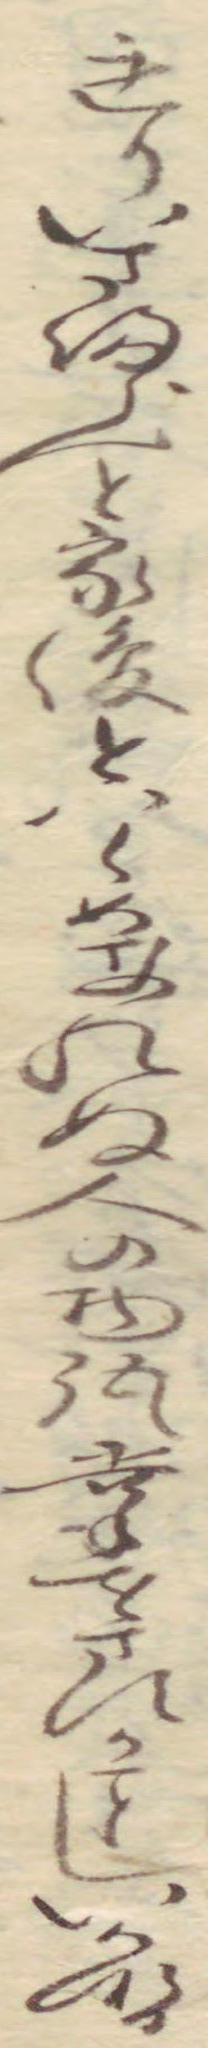れりいさ帰らんと家俊とはくめなれぬ人の物語掌をさすかことしいかなる
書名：鶯宿雑記. 巻263-264
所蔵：国立国会図書館 National Diet Library, JAPAN
